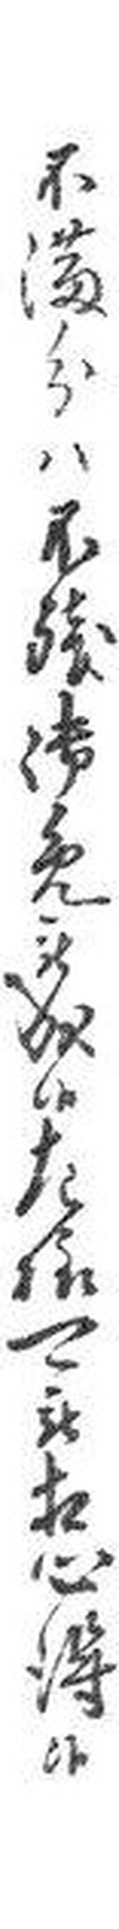不満分ハ不残御免被成候左様可被相心得候
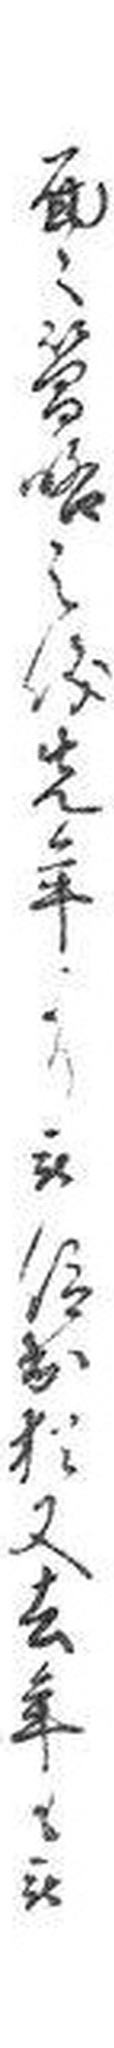面々簡略之儀先年より被仰出猶又去年も被
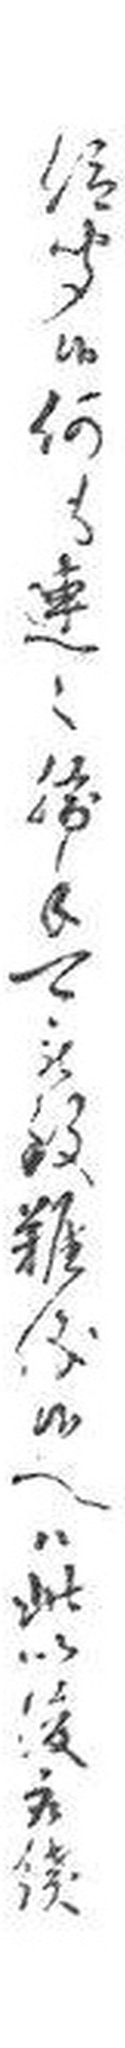仰聞候何も連々勝手可被致難儀候ヘハ此以後取続
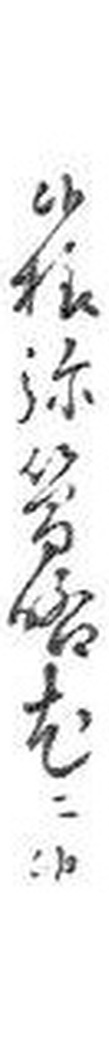候様弥簡略尤ニ候
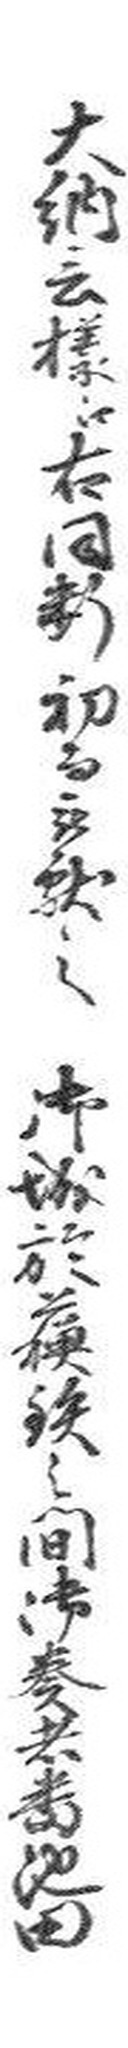大納言様江右同断初而被献之御城於蘇鉄之間御奏者番池田
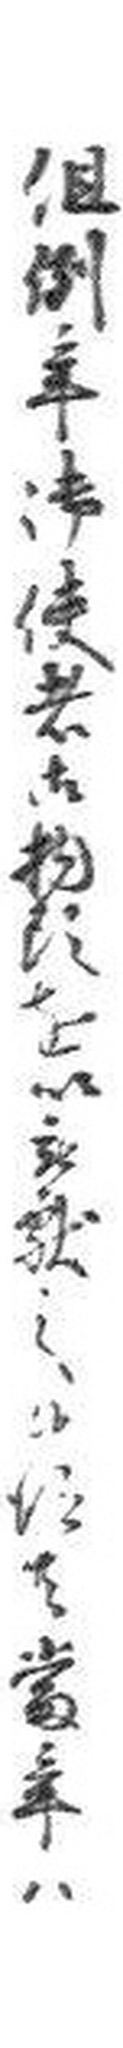但例年御使者御物頭を以被献之候得共当年ハ
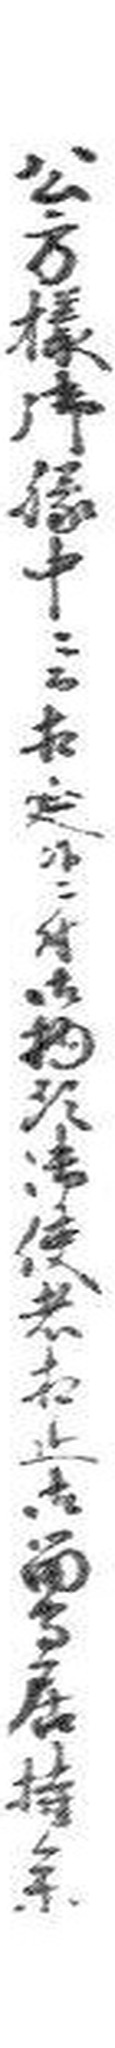公方様御朦中ニ而相延候ニ付御物頭御使者相止御留守居持参
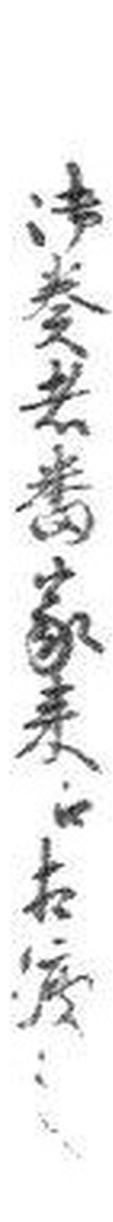御奏者番家来江相渡之
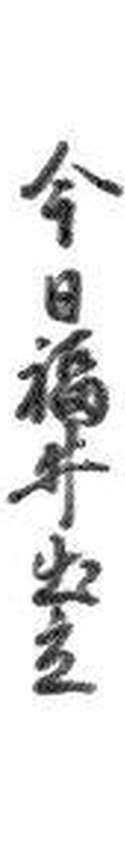今日福井出立
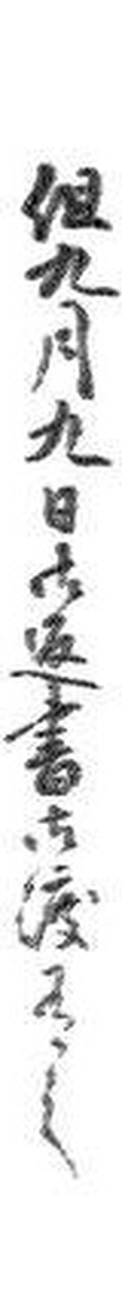但九月九日御返書御渡有之
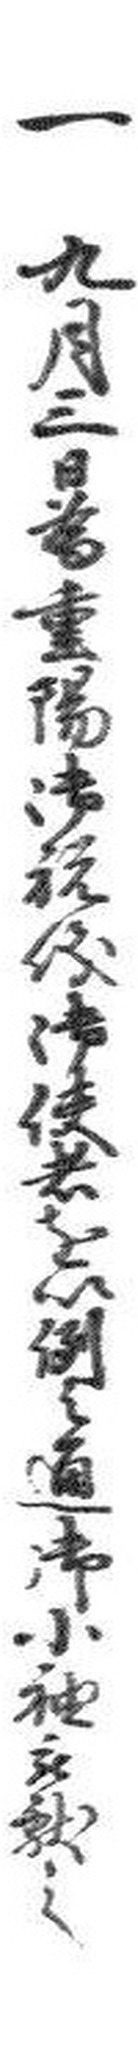一九月三日為重陽御祝儀御使者を以例之通御小袖被献之
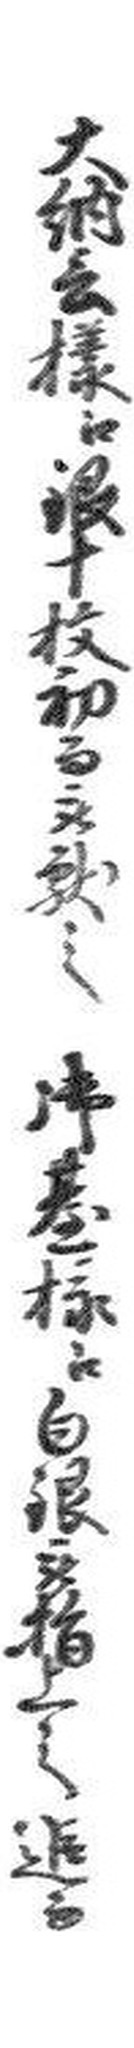大納言様江銀十枚初而被献之御台様江白銀被指上之追而
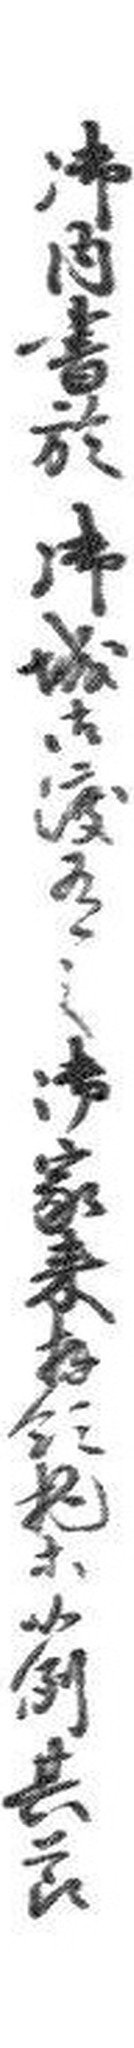御内書於御城御渡有之御家来拝領物等如例其節

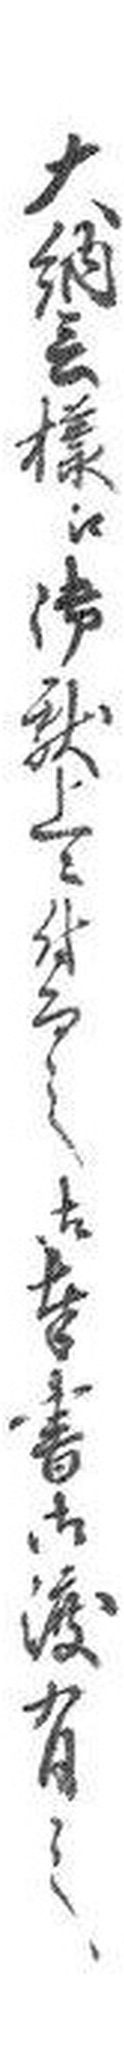大納言様江御献上ニ付而之御奉書御渡有之
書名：家譜 二十三 吉品公 従宝永元年到同二年
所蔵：福井県文書館 Fukui Prefectural Archives
